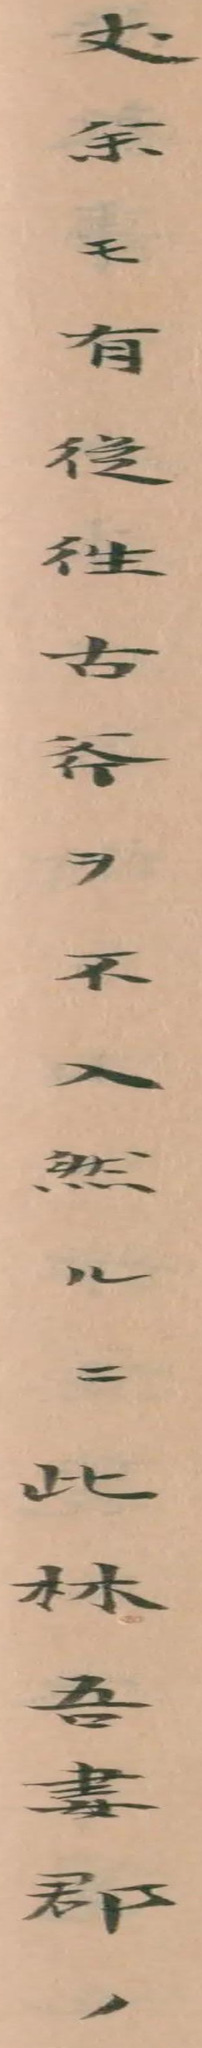丈余モ有経往古斧ヲ不入然ル二此林吾妻郡ノ
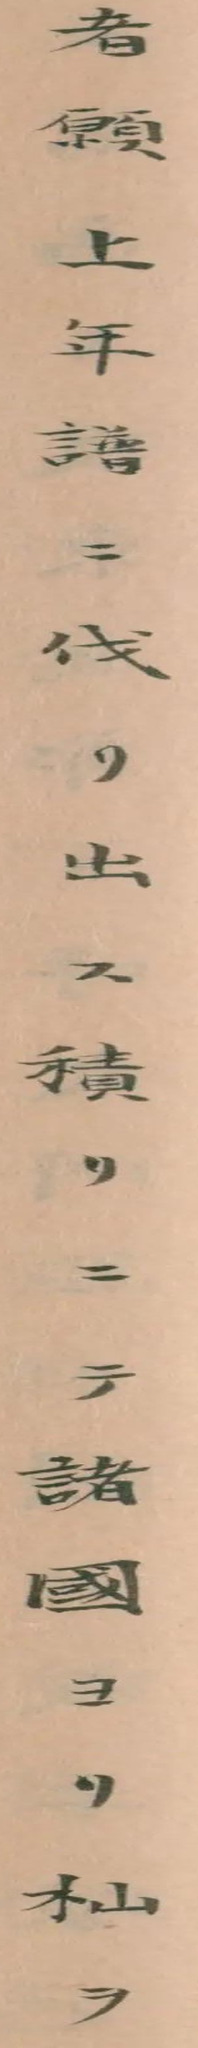者願上年譜二伐り出ス積りニテ諸国ヨリ杣ヲ
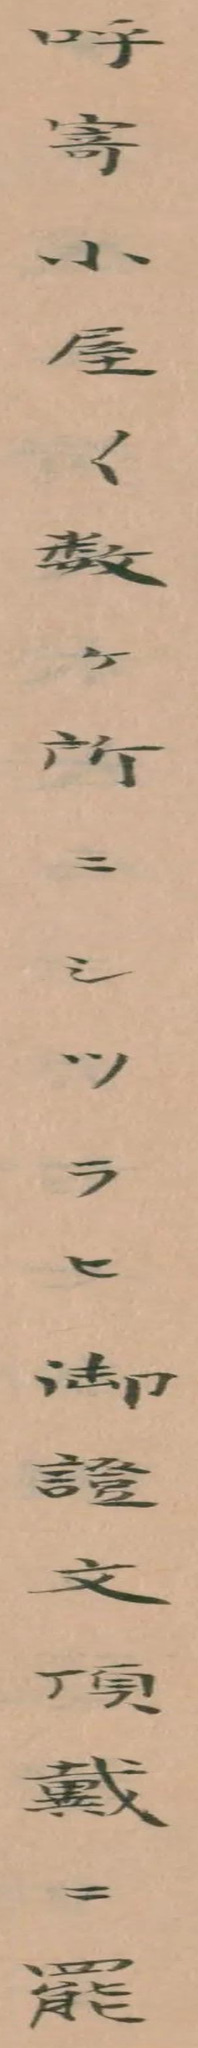呼寄小屋〳〵数ヶ所二シツラヒ御證文頂戴二罷
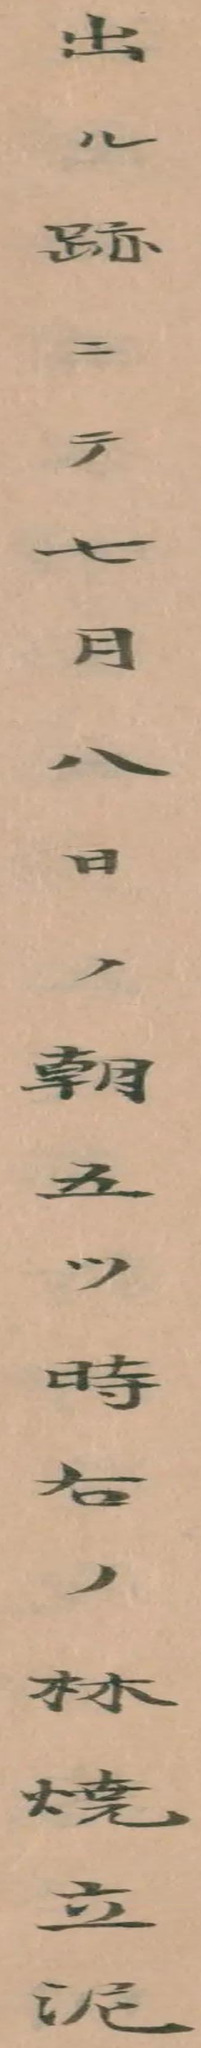出ㇽ跡二テ七月八日ノ朝五ッ時右ノ林焼立泥
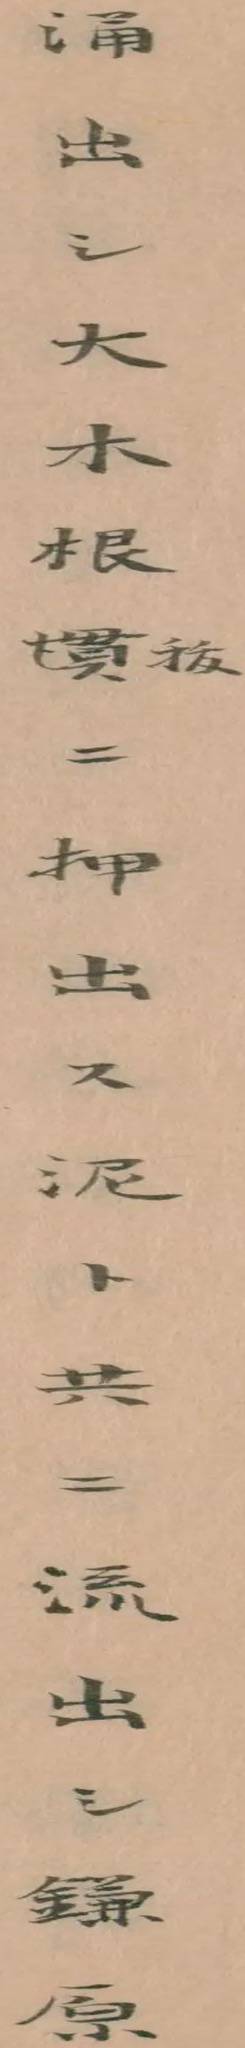湧出シ大木根抜二押出ス泥ト共二流出シ鎌原
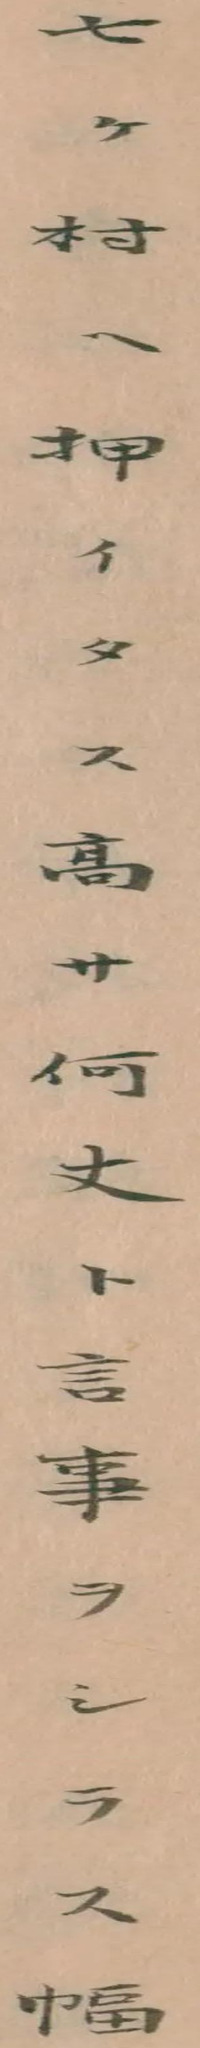七ケ村へ押イタス高サ何丈ト言事ヲシラス巾
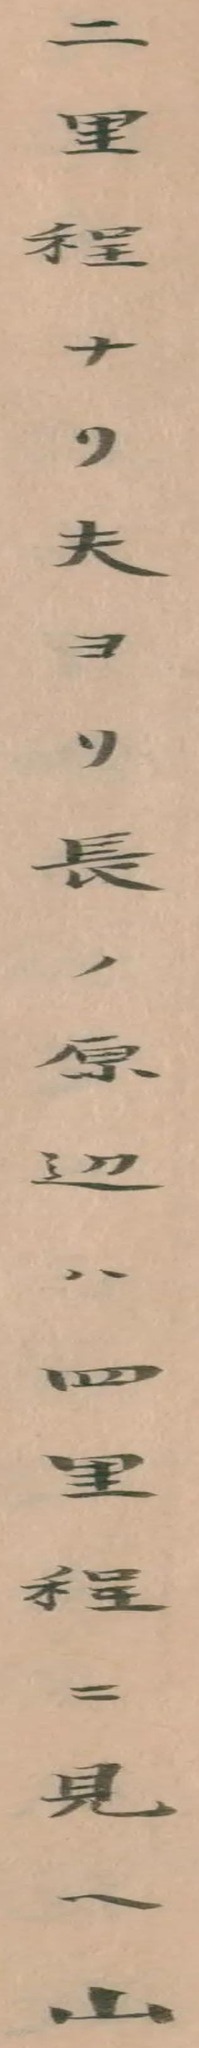二里程ナリ夫ヨリ長ノ原辺ハ四里程二見へ山
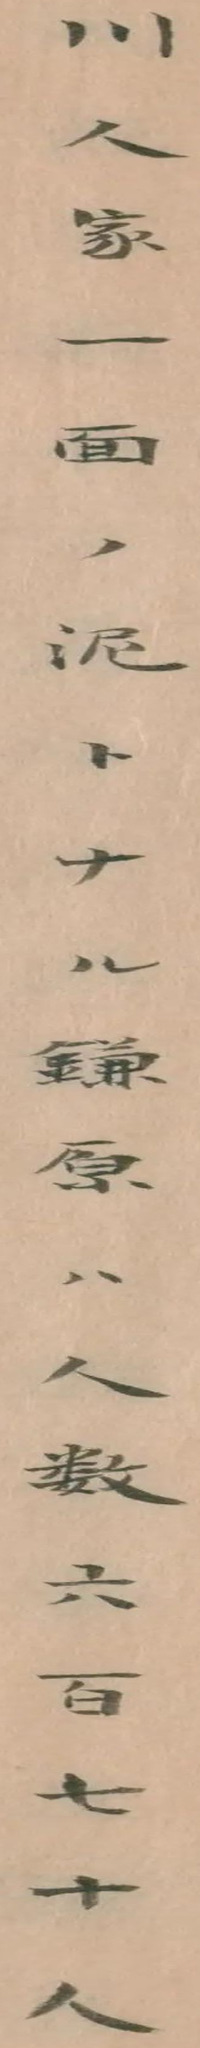川人家一面ノ泥トナル鎌原ハ人数六百七十人
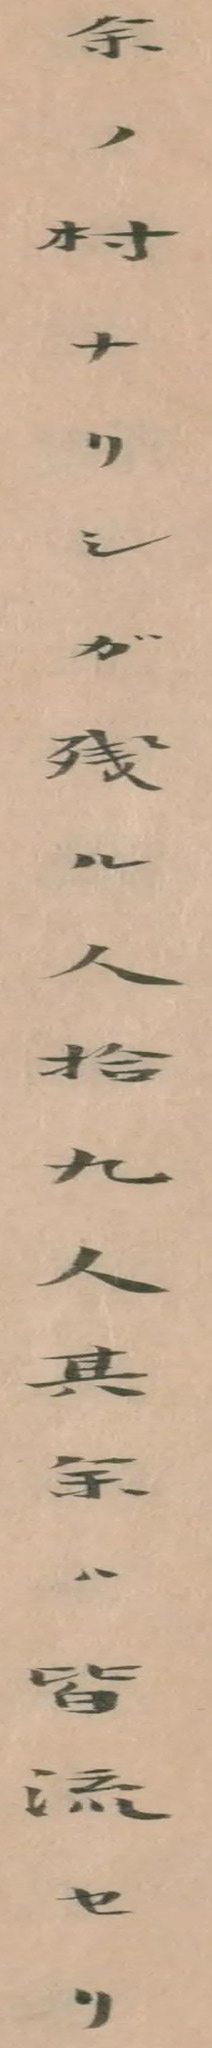余ノ村ナリシカ残ル人拾九人其余ハ皆流セリ
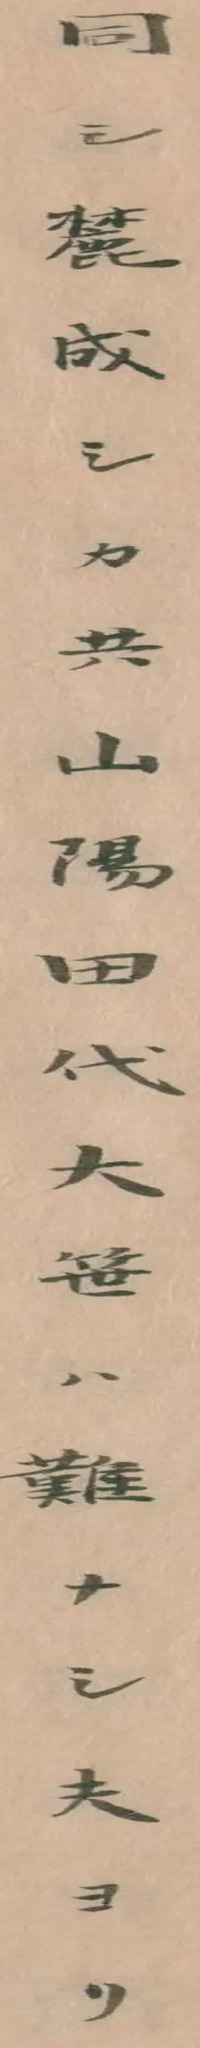同シ麓成シカ共山陽田代大笹ハ難ナシ夫ヨリ
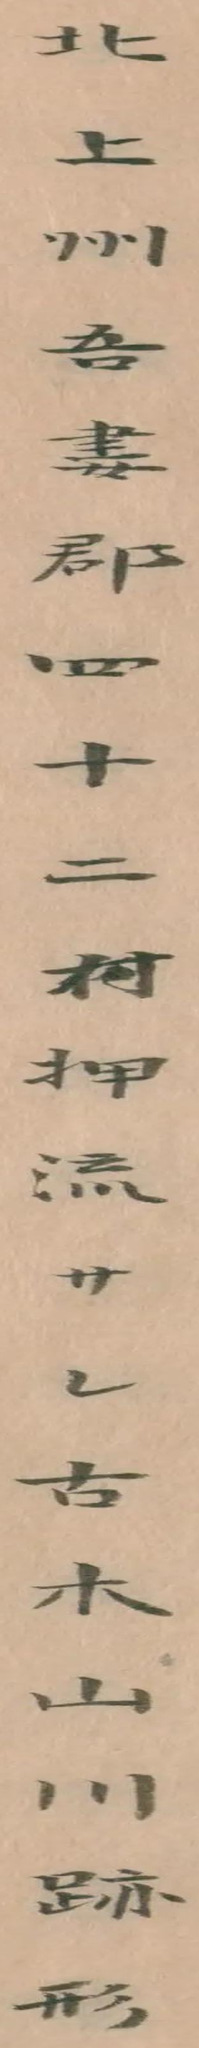北上州吾妻郡四十二村押流サレ古木山川跡形

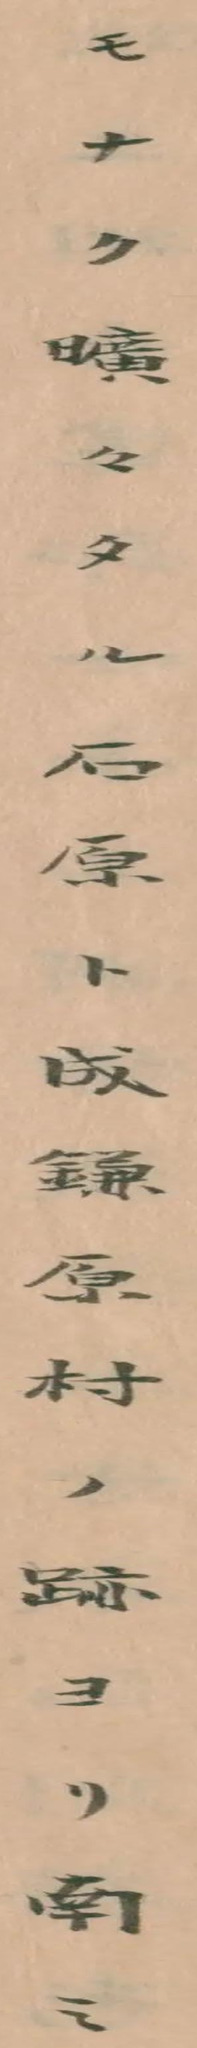モナク曠々タル石原ト成鎌原村ノ跡ヨリ南ミ
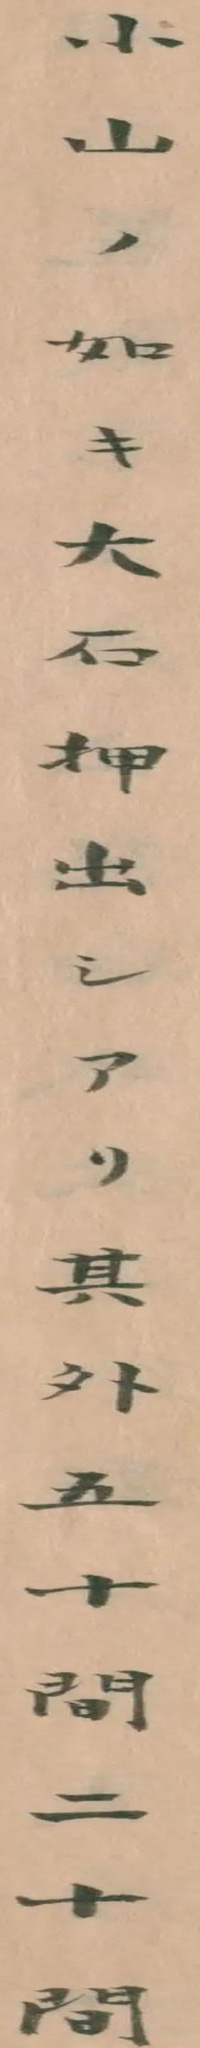小山ノ如キ大石押出シアリ其外五十間二十間
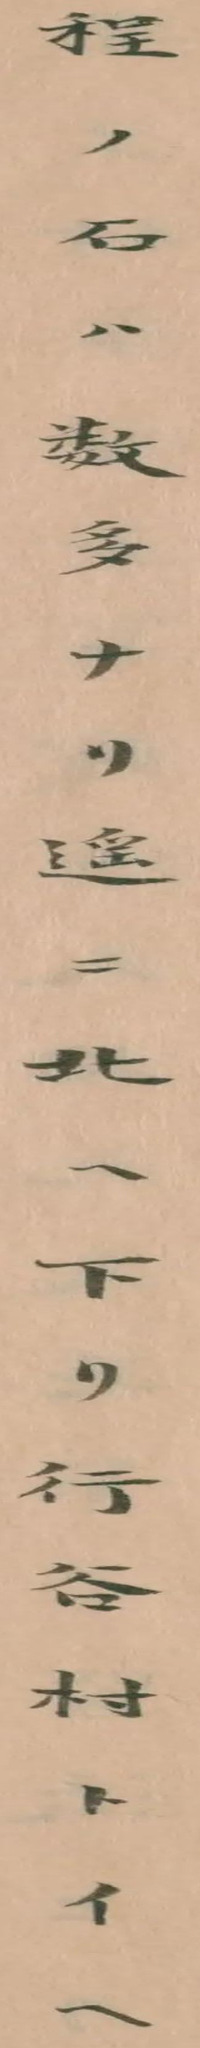程ノ石ハ数多ナリ遥二北へ下り行谷村トイへ
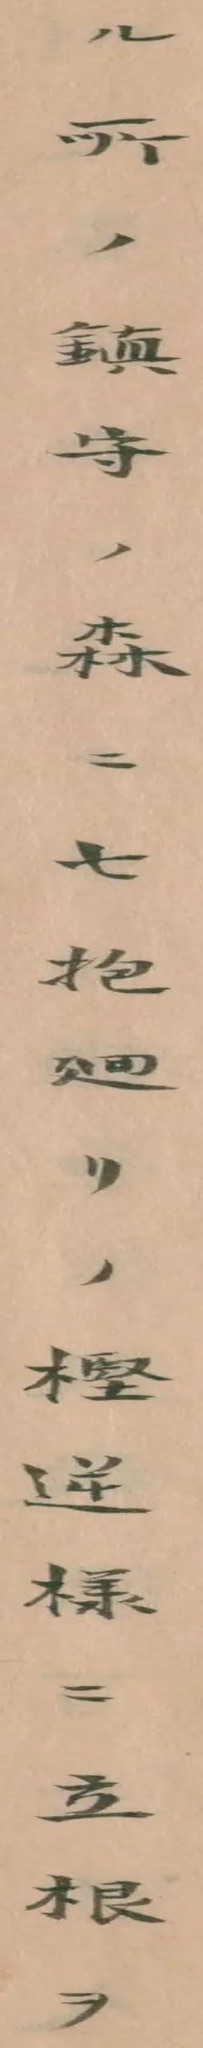ル所ノ鎮守ノ森二七抱廻りノ樫逆様二立根ヲ
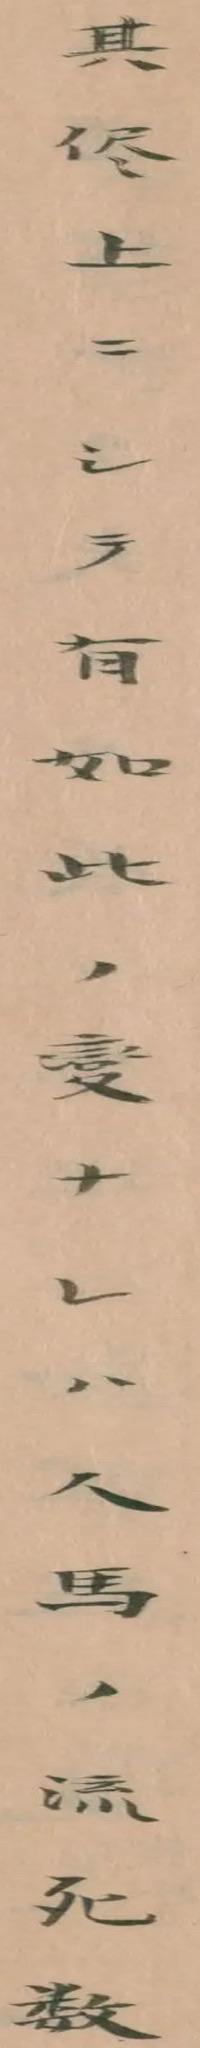其儘上二シテ有如此ノ変ナレハ人馬ノ流死数
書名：地災撮要. 巻3(地震之部)-巻4(噴火之部)
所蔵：国立国会図書館 National Diet Library, JAPAN
